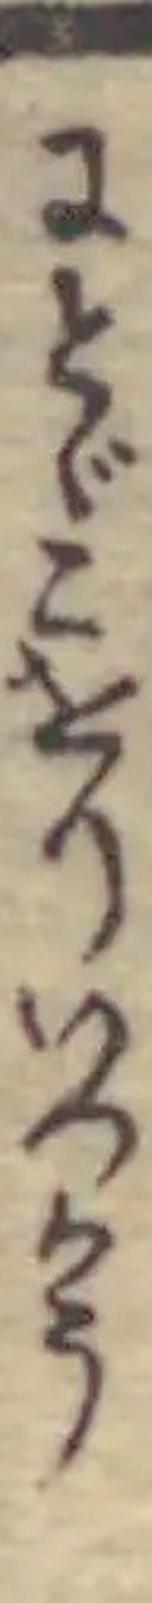にとゞこをりいつかう
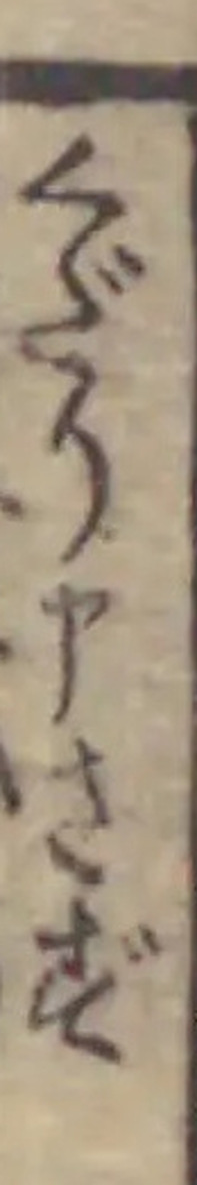くだり申さず
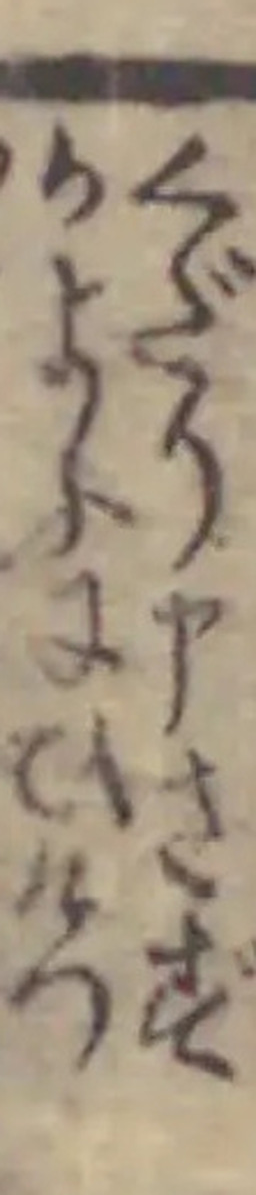かよふにひけつ
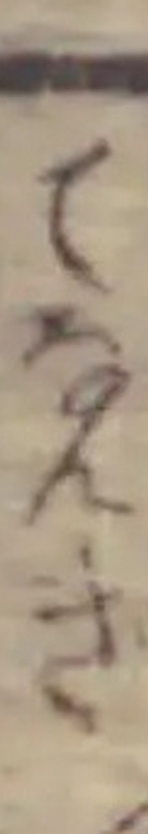てなんぎ
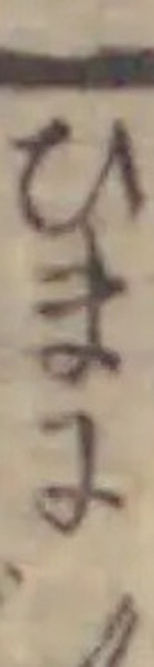ひまに
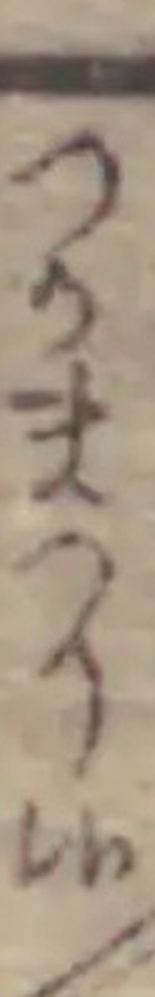つかまつり候
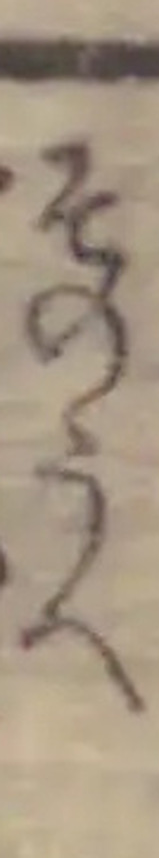そのうへ
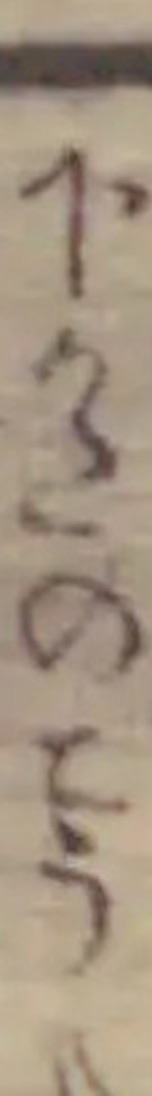下かたのこう
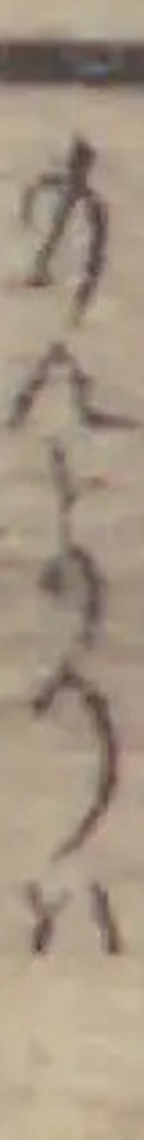もんよりは
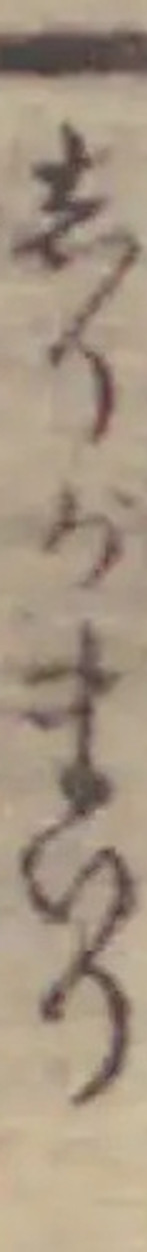しりがまいり
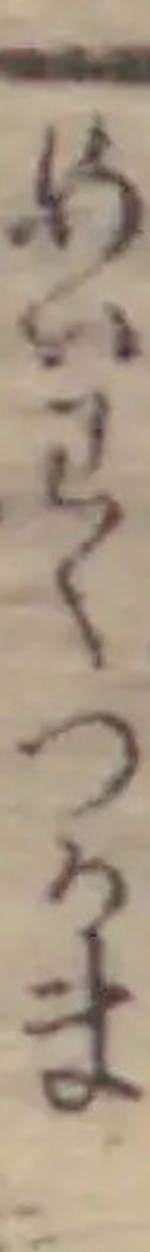めいわくつかま
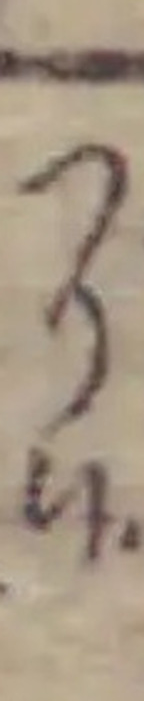つり候
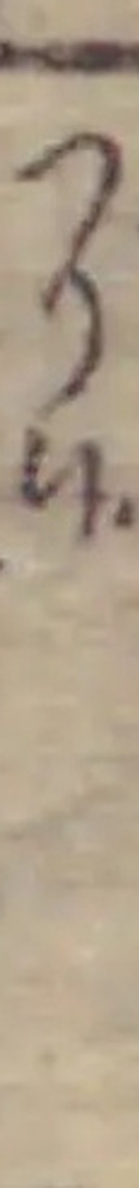つり候
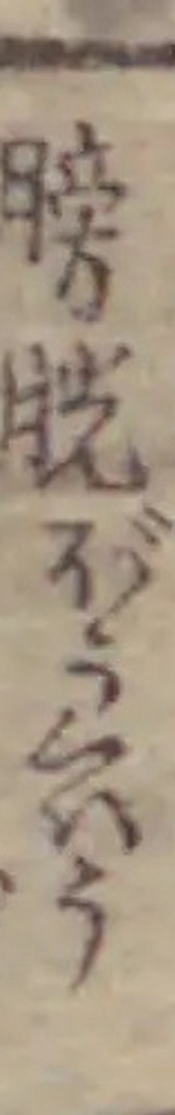膀胱ぼうくはう
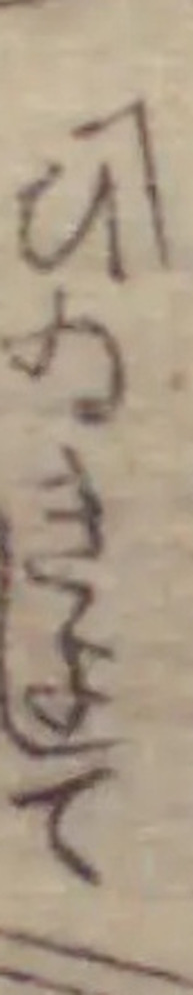〽ひゐきよして
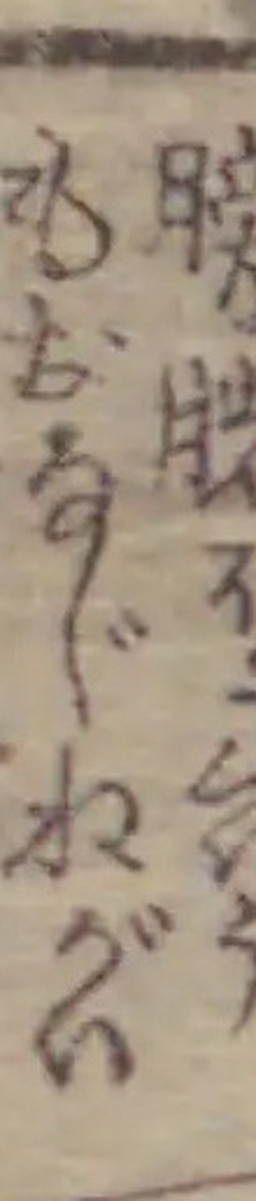もおなじねがい
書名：腹内養生主論 3巻
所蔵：国立国会図書館 National Diet Library, JAPAN
